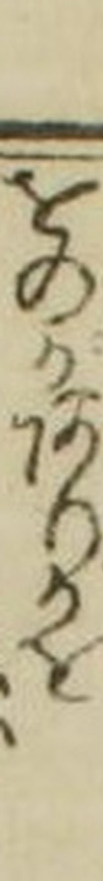をのがありかを
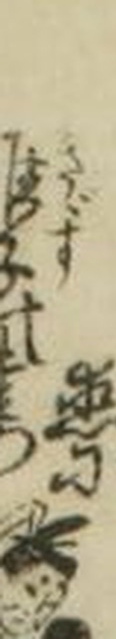雉子の妻
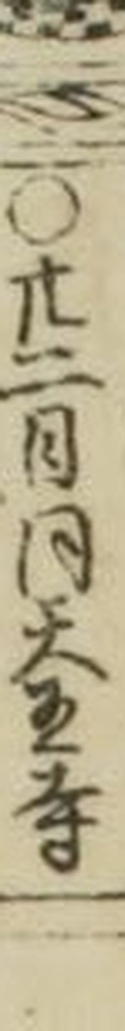○廿二日同天王寺
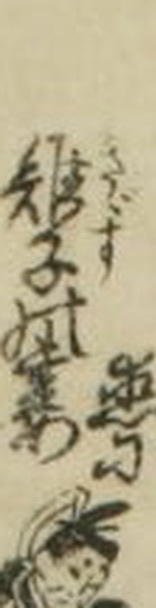雉子の妻
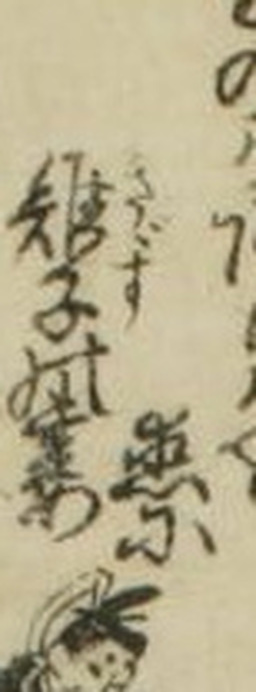雉子の妻
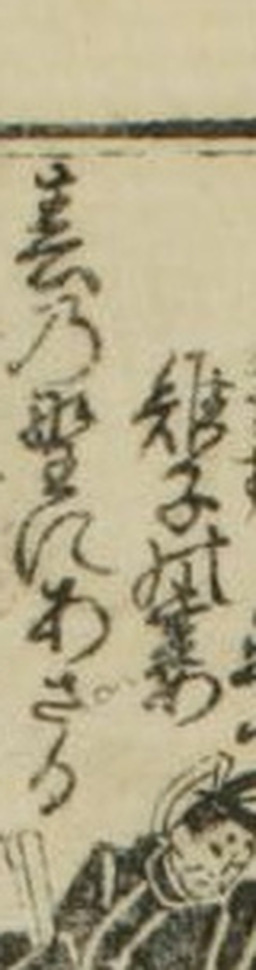春の野にあざる
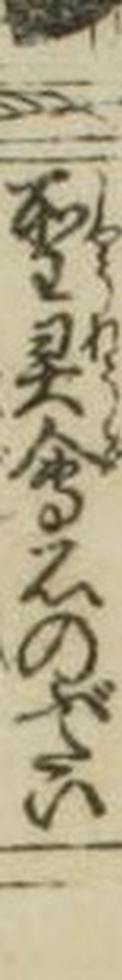聖霊会石のぶたい
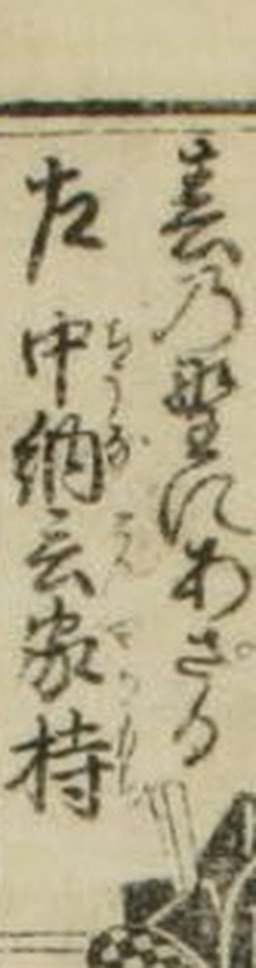左中納言家持
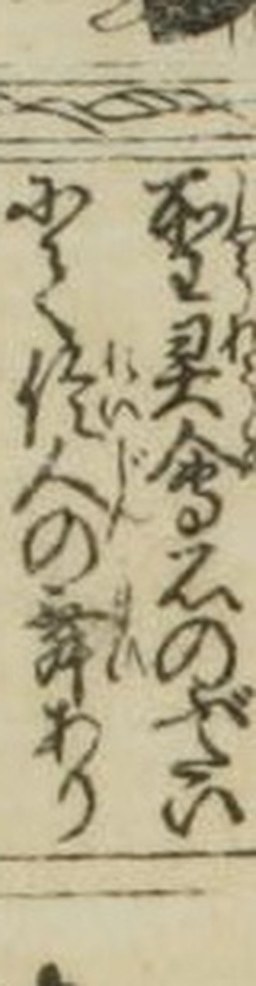にて伶人の舞あり
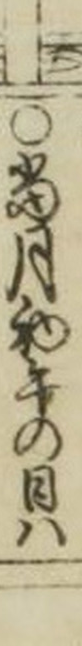○当月初午の日は
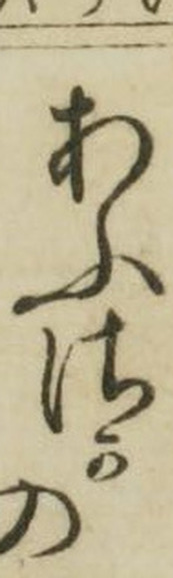あふさかの
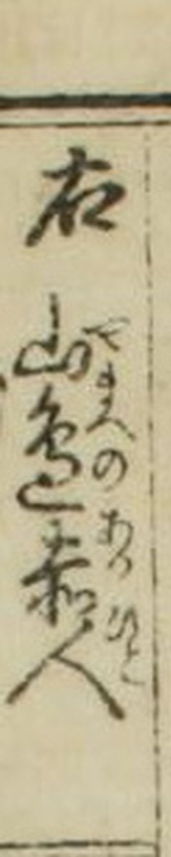右山部赤人
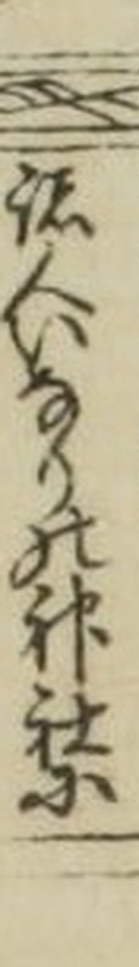諸人いなりの神社に
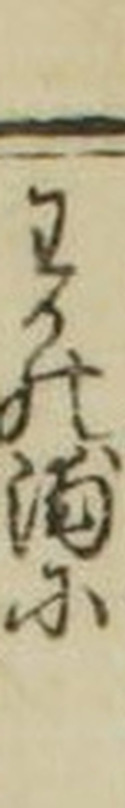わかの浦に
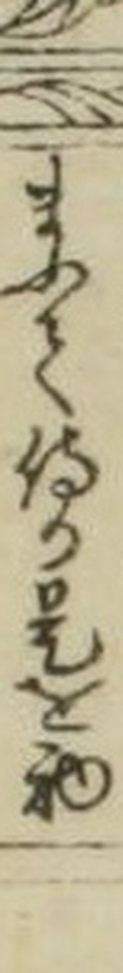まふて侍る是を初
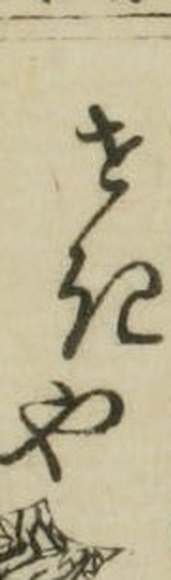せきや
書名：女源氏教訓鑑
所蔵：東京学芸大学附属図書館
